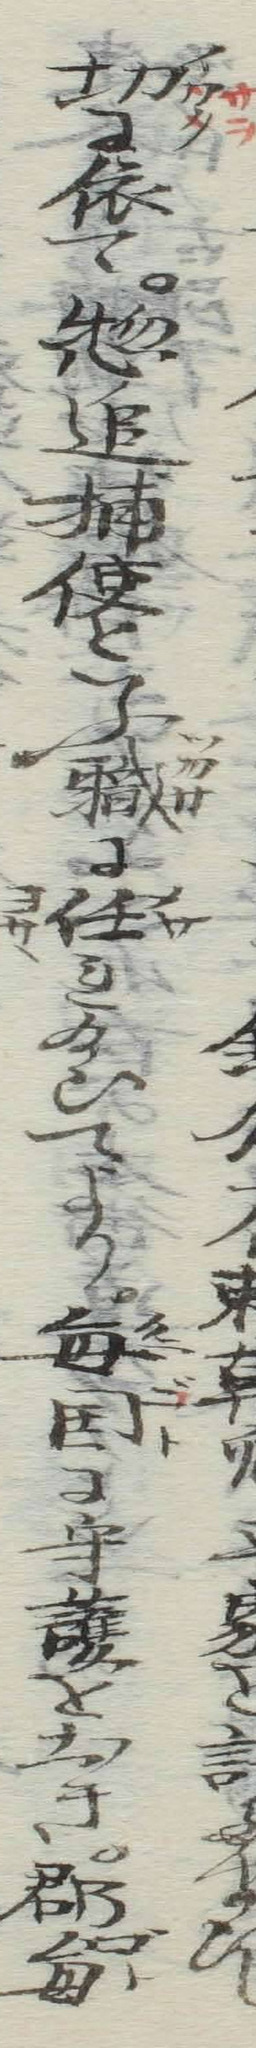功に依て。惣追捕使といふ職に任れ給ひてより。毎国に守護をおき。郡毎
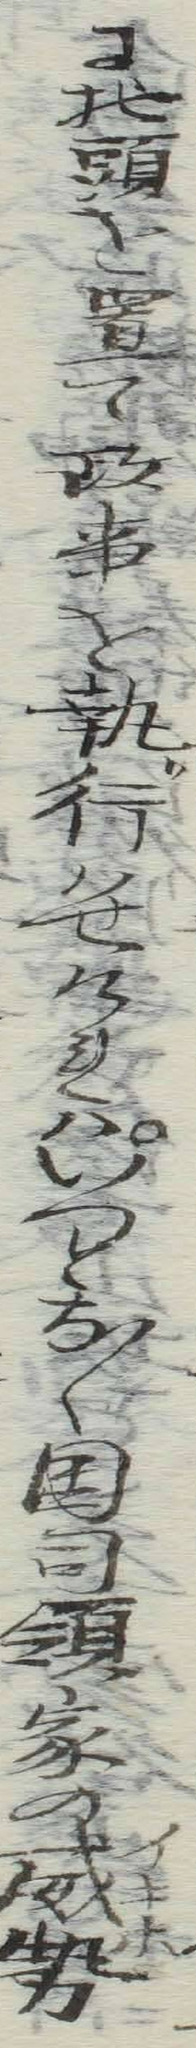に地頭を置て政事を執行はせけれは。いつとなく国司領家の威勢
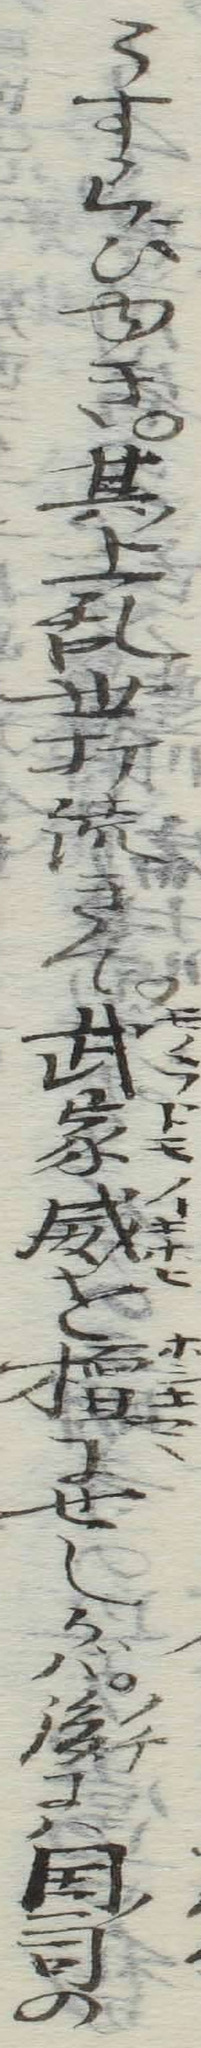うすらひゆき。其上乱世打続きて。武家威を檀にせしかば。後には国司の
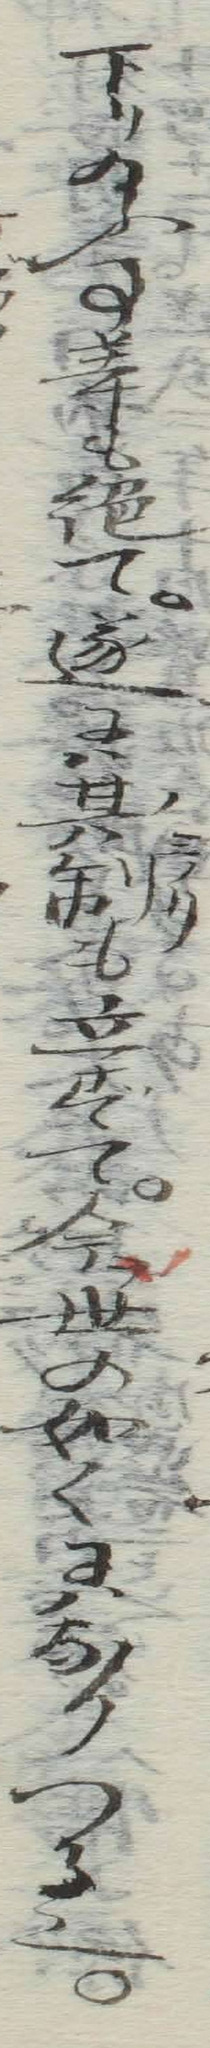下り給ふ事等も絶て。遂には其制も立ずて。今世の如くにはなりつる也。
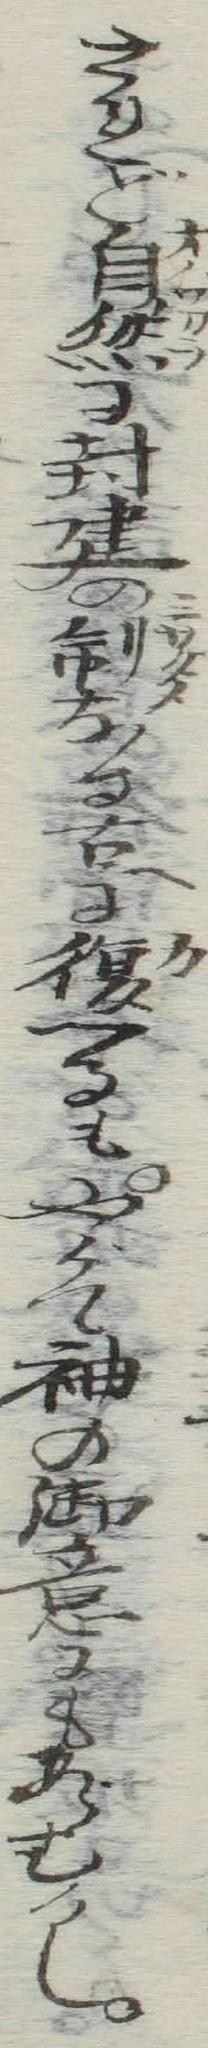されど自然に封建の制なる古に復へるも。やがて神の御意にもあらむかし。
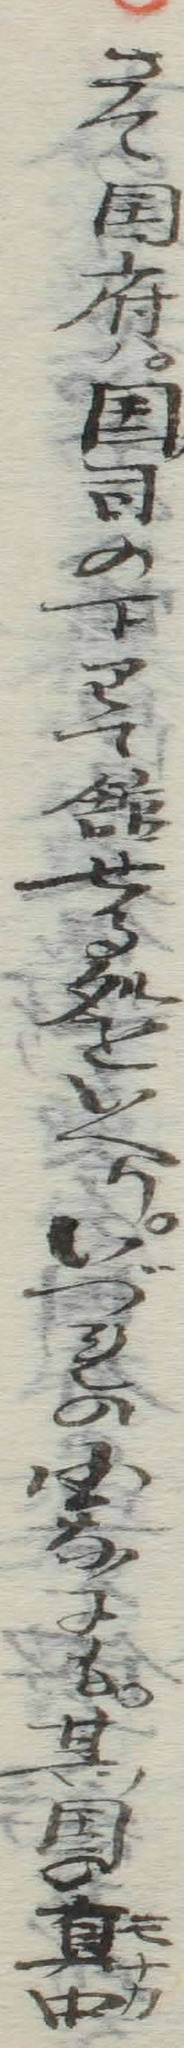さて国府は。国司の下りて舘せる処をいへり。いづれの国なにも。其国の真中

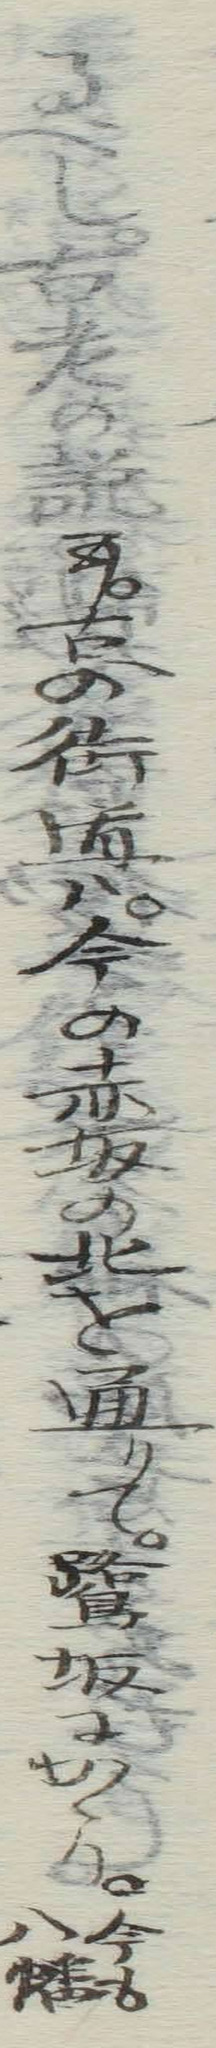るべし。古老の説云。古の街道は。今の赤坂の北を通りて。鷺坂に切たり。今も八幡
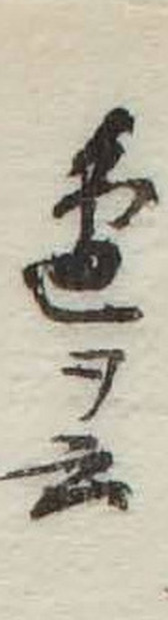辺ヲ云
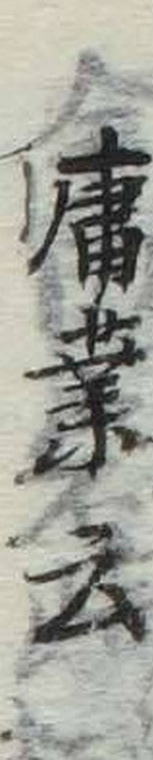庸業云
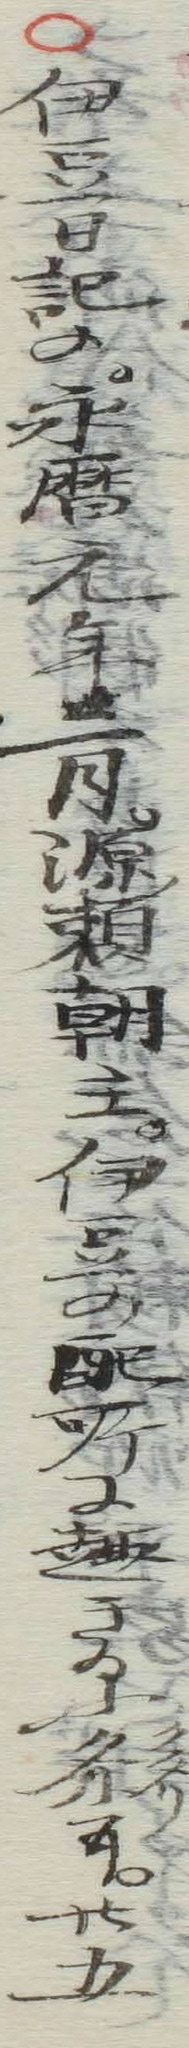○伊豆日記の。永暦元年二月。源頼朝主。伊豆の配所に趣き給ふ条に。廿五

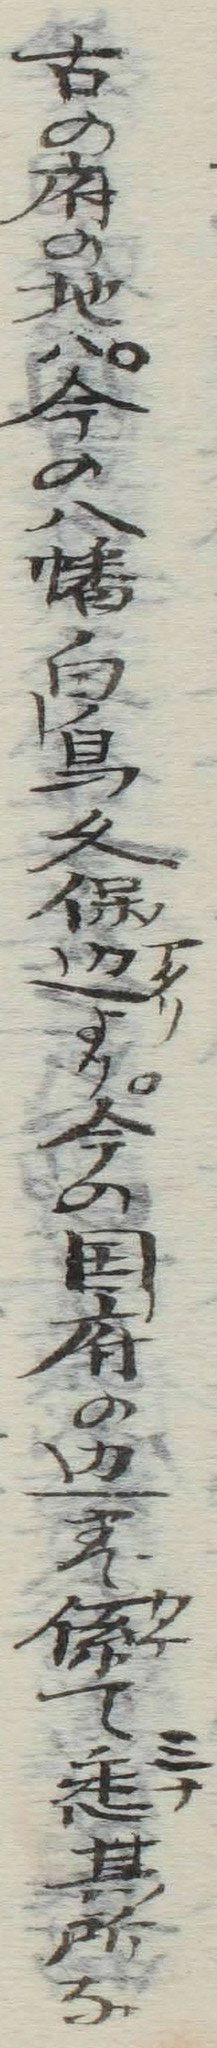〇古の府の地は。今の八幡白鳥久保辺より。今の国府の辺まで係て悉其所な
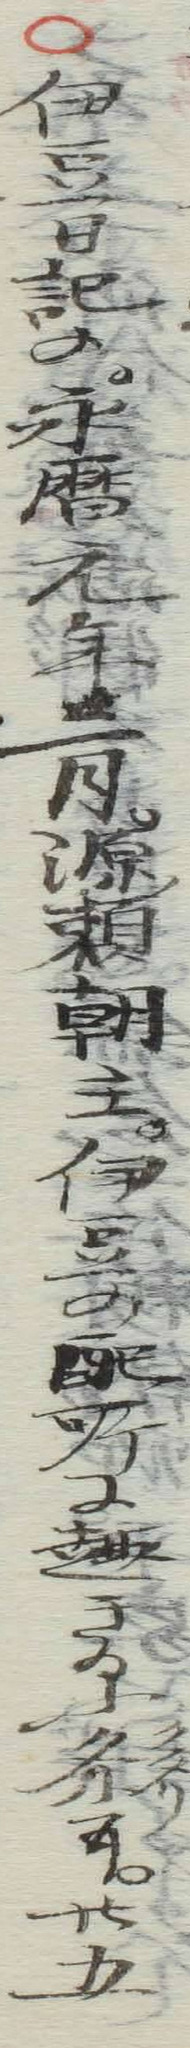〇伊豆日記の。永暦元年三月。源頼朝主。伊豆の配所に趣き給ふ条に。廿五
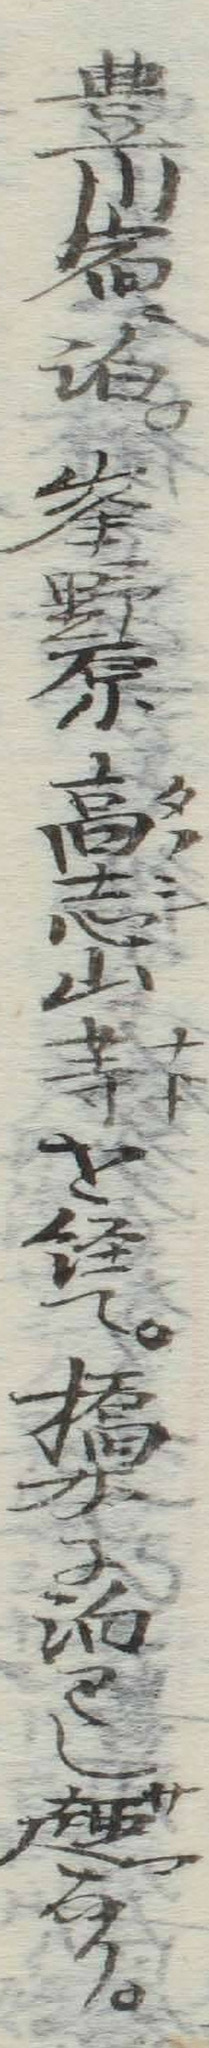豊川宿泊。峯野原高志山等を経て。橋本に泊りし趣なり。
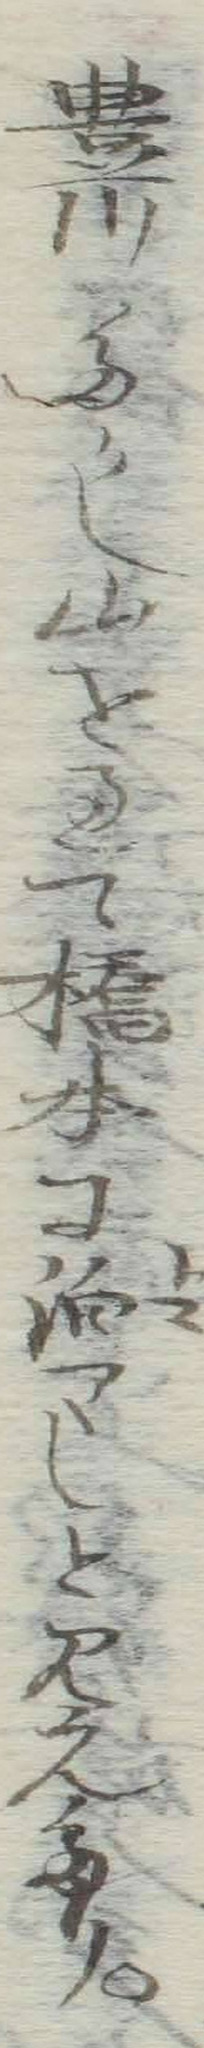豊川たかし山をへて橋本に泊りしと見えたり。
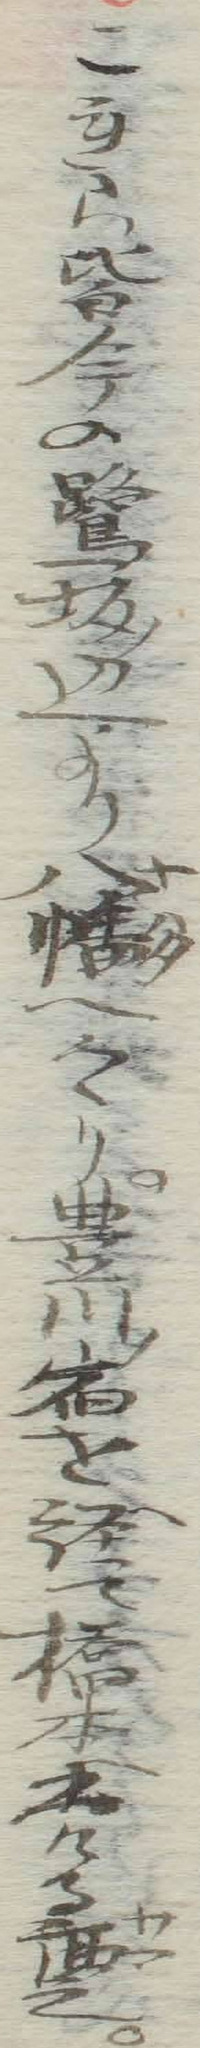〇これら皆今の鷺坂辺より八幡へかゝり。豊川宿を経て橋本へ出ける趣也。

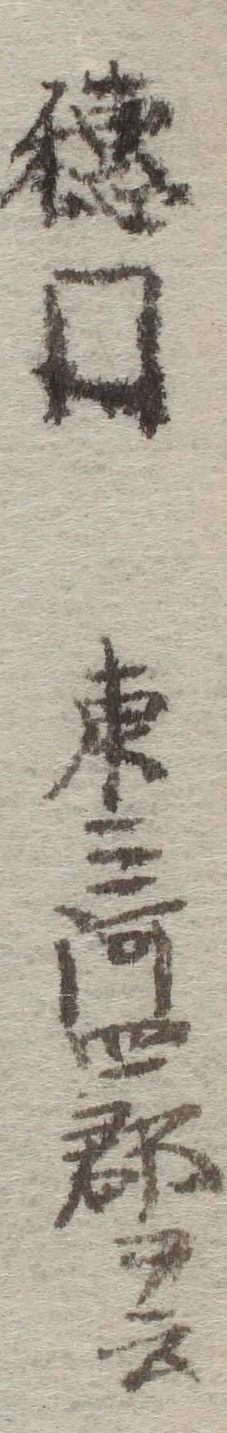穂国東三河四郡ヲ云
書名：三河国古跡考
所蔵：国文学研究資料館
